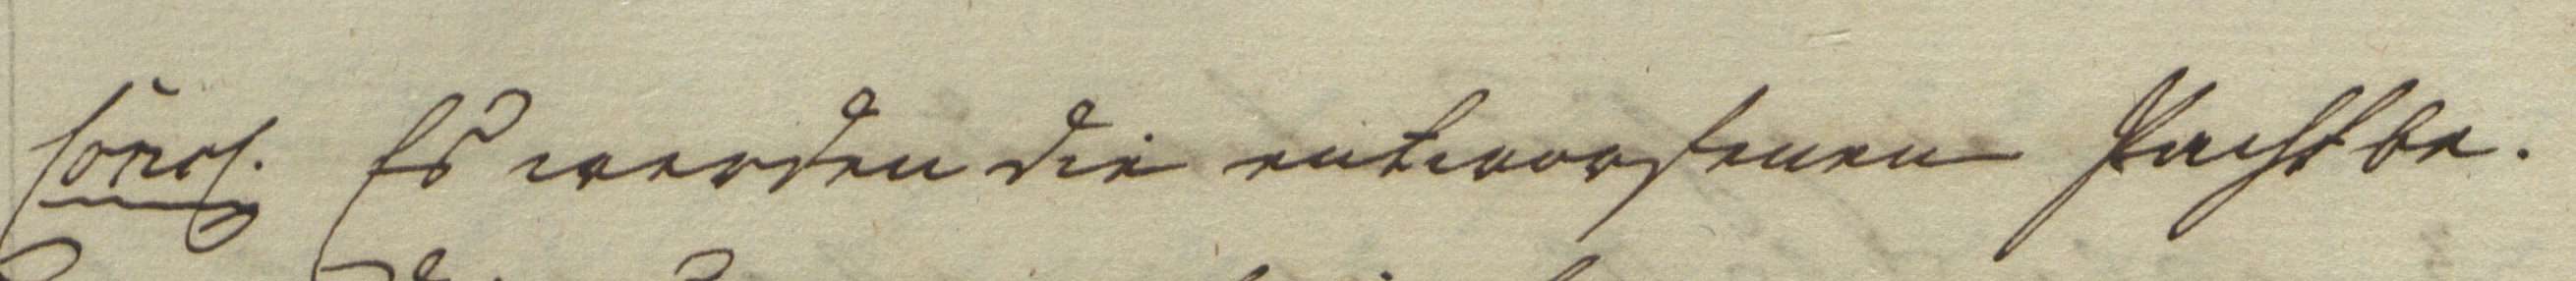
Concl. Es werden die entworfenen Pachtbe¬
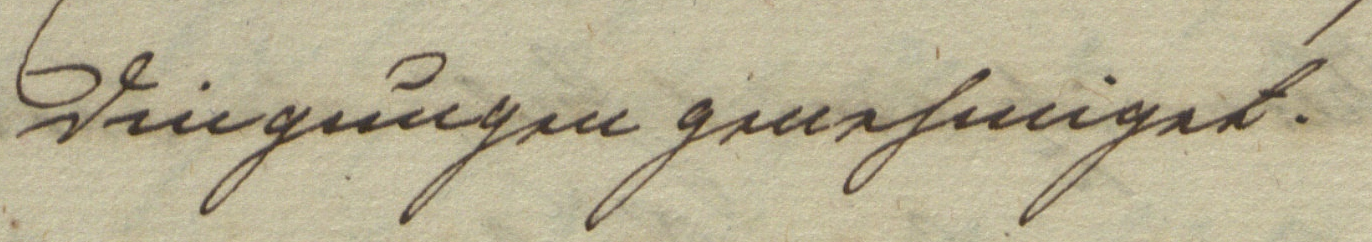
dingungen genehmiget.
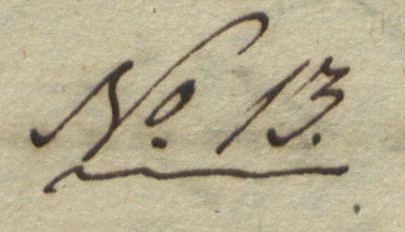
No 13.
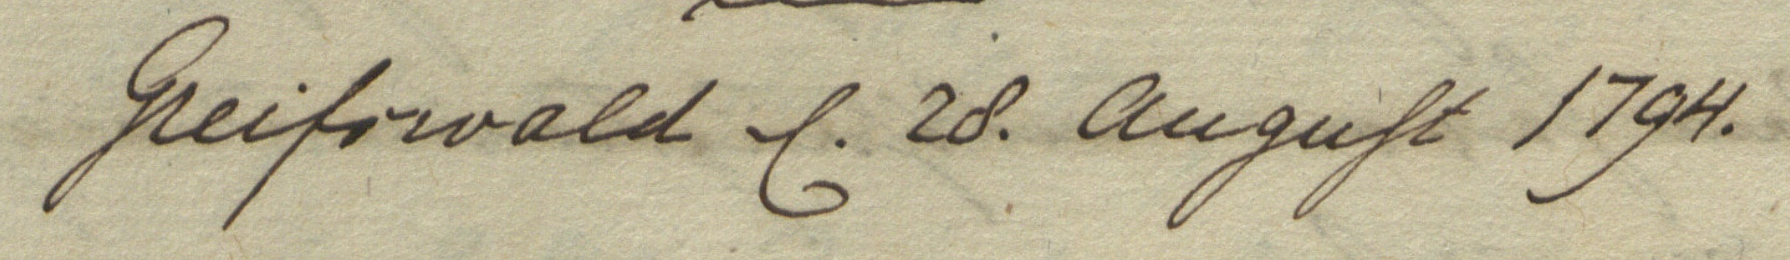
Greifswald d. 28. August 1794.
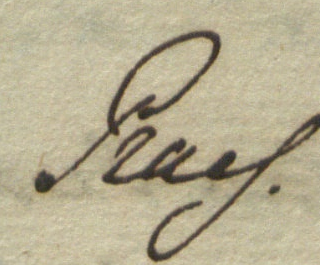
Praes.
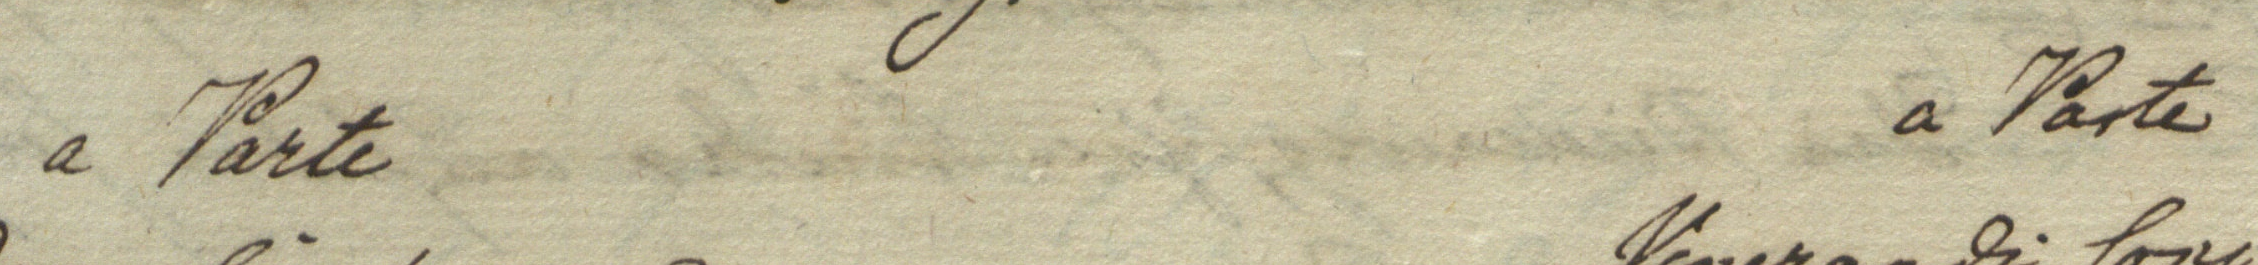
a Parte a Parte
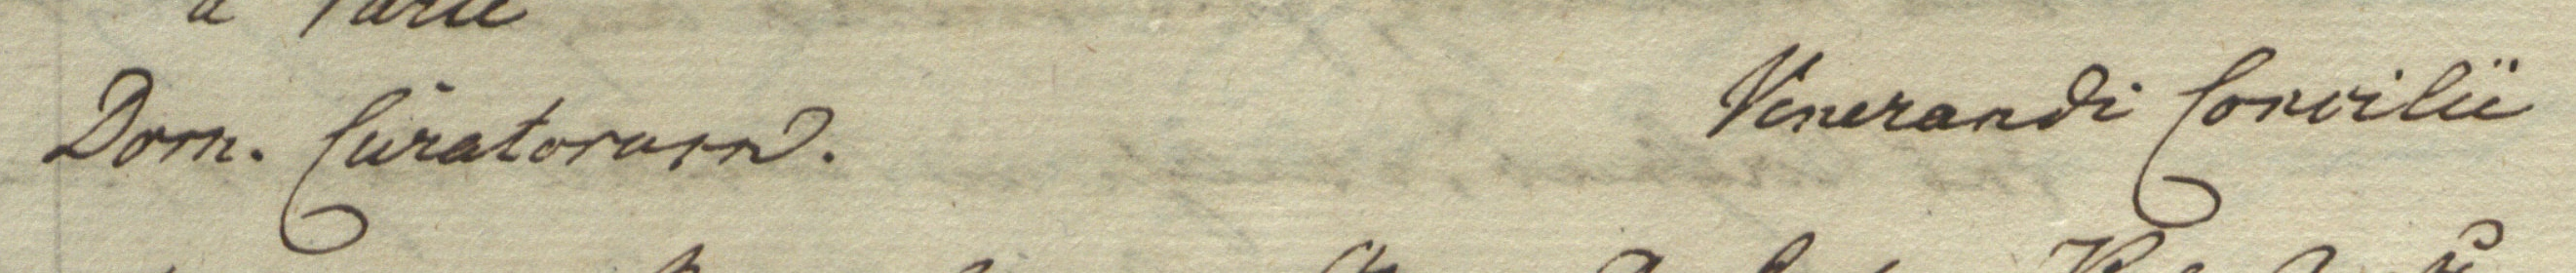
Dom. Curatorum. Venerandi Concilii
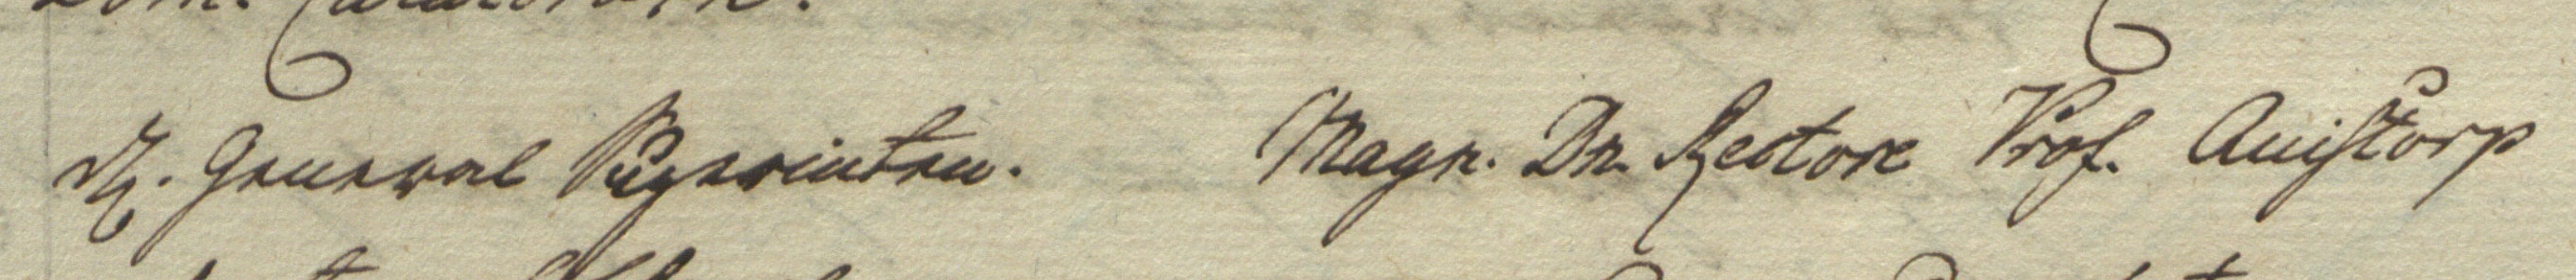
dh. General Superinten¬ Magn. Dn. Rectore Prof. Quistorp
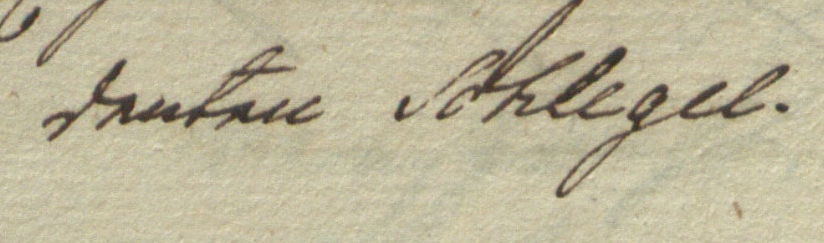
denten Schlegel.
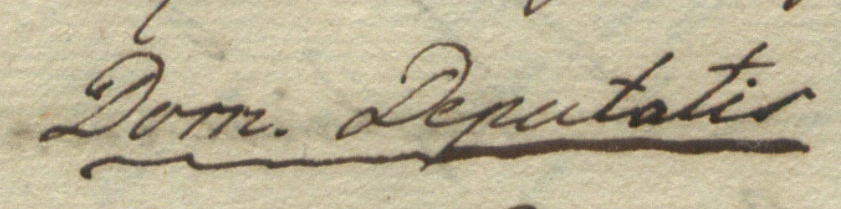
Dom. Deputatis
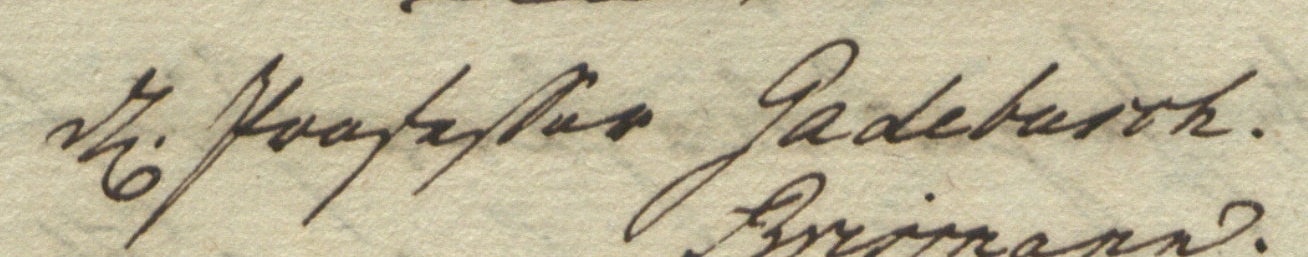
dh. Professor Gadebusch.
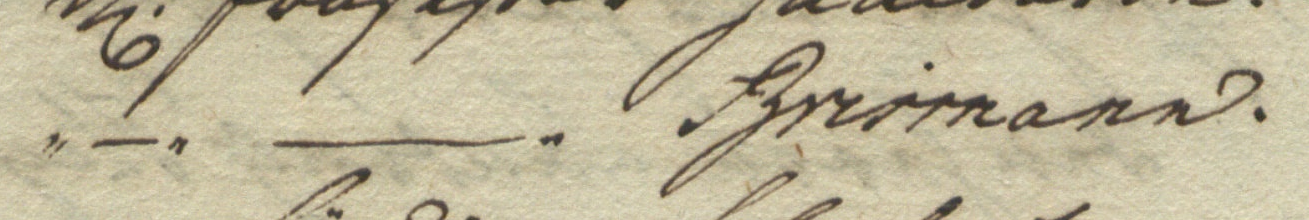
Brismann.
